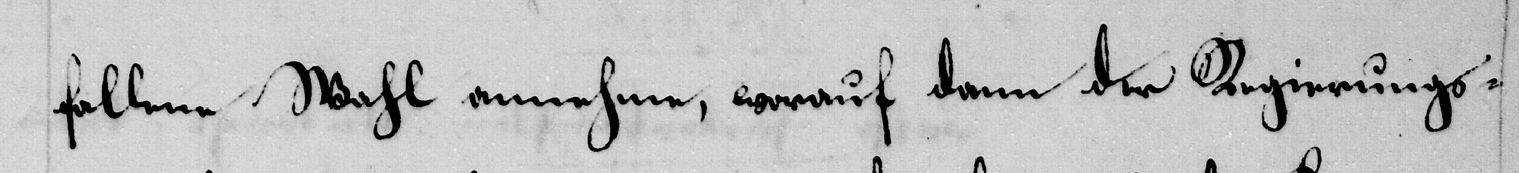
fallene Wahl annehmen, worauf dann der Regierungs¬
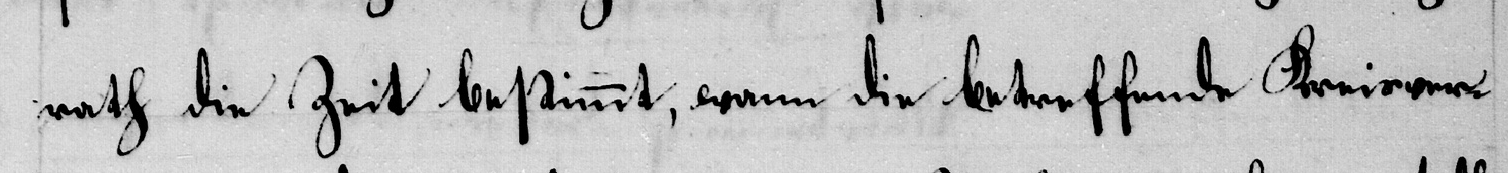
rath die Zeit bestimmt, wann die betreffende Kreisver¬
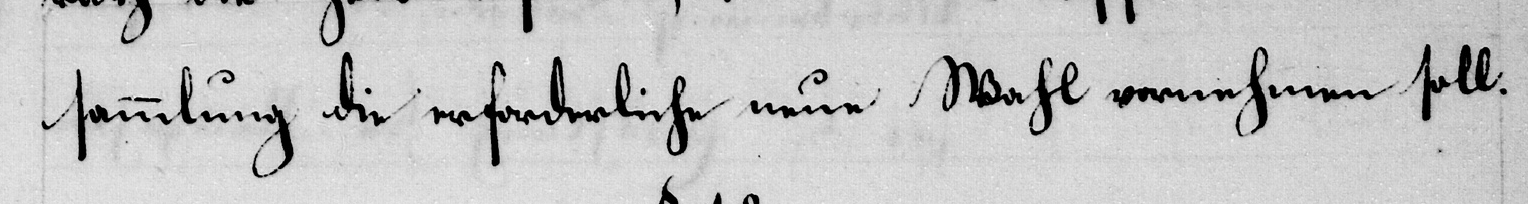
sammlung die erforderliche neue Wahl vornehmen soll.
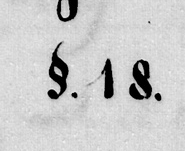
§.18.
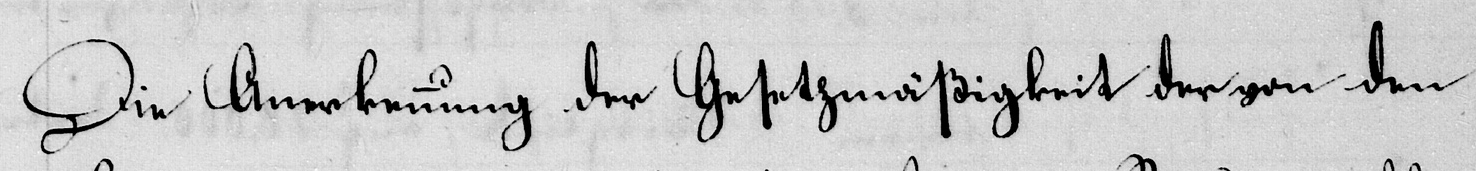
Die Anerkennung der Gesetzmäßigkeit der von den
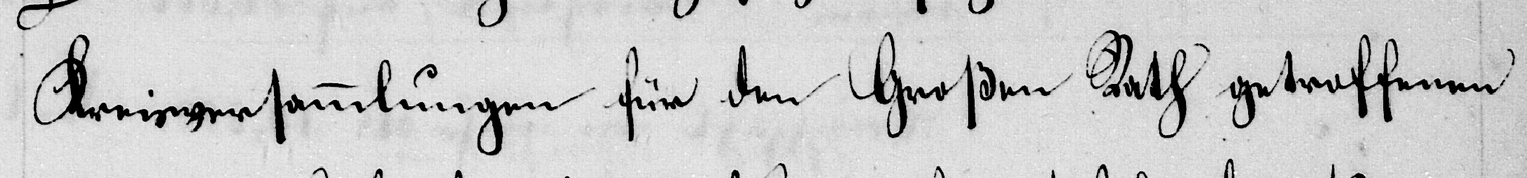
Kreisversammlungen für den Großen Rath getroffenen
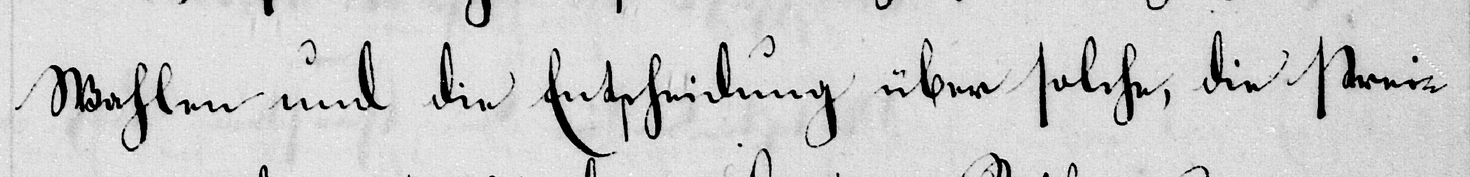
Wahlen und die Entscheidung über solche, die stre¬
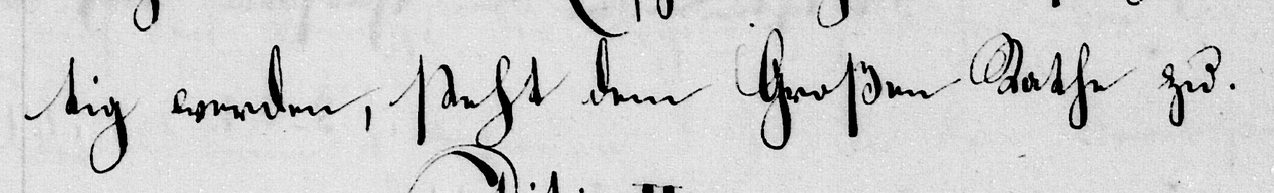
itig werden, steht dem Großen Rathe zu.
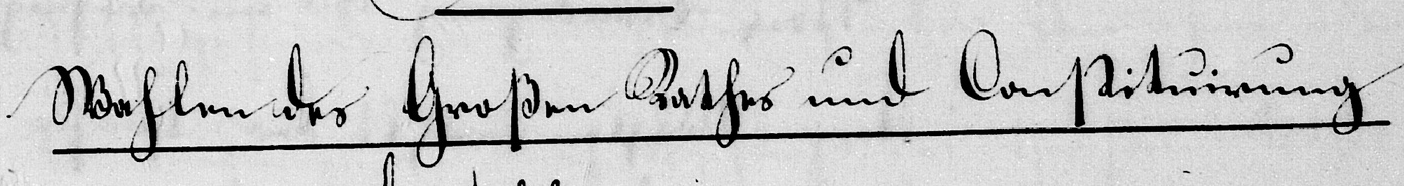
Wahlen des Großen Rathes und Constituirung
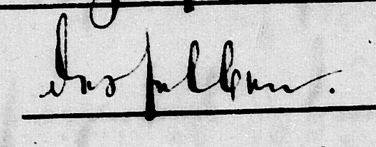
desselben.
